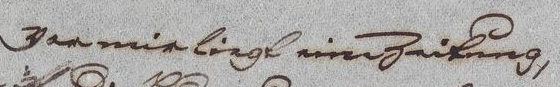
Vor mir liegt eine Zeitung,
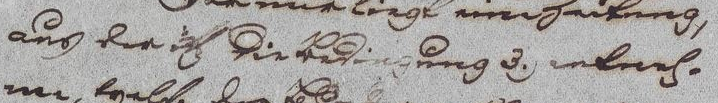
aus der ich die Bedingung 3.) entneh-
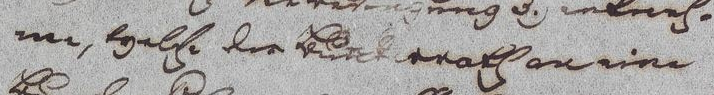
me, welche der Bundesrath an eine
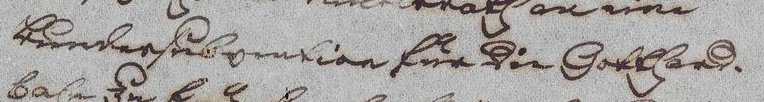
Bundessubvention für die Gotthard-
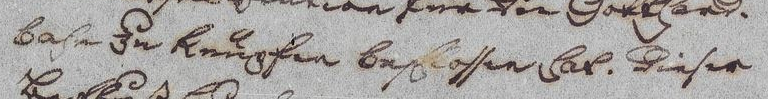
bahn zu knüpfen beschlossen hat. Dieser
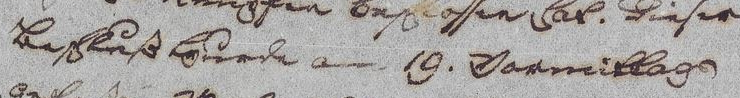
Beschluss wurde am 19. Vormittags
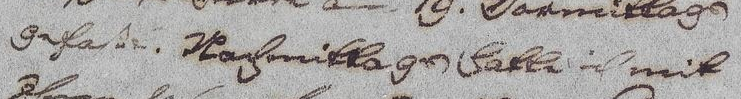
gefaßt. Nachmittags hatte ich mit
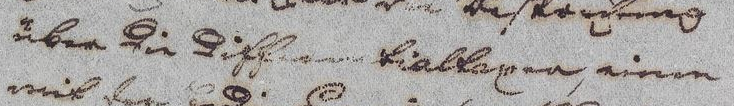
über die Differentialtaxen, einen
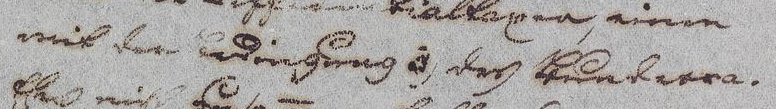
mit der Bedingung 3.) des Bundesra-
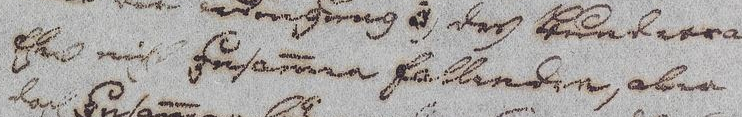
thes nicht zusammen fallenden, aber
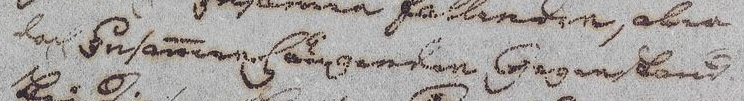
doch zusammenhängenden Gegenstand.
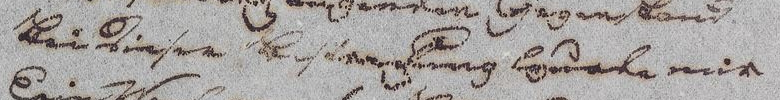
Bei dieser Besprechung wurde mir
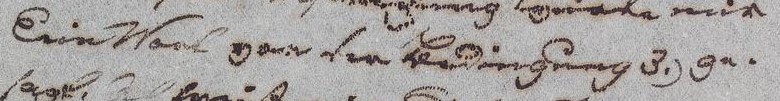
kein Wort von der Bedingung 3.) ge-
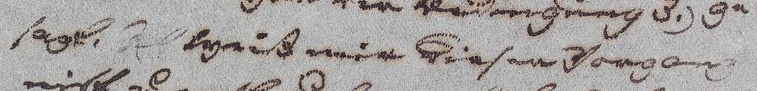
sagt. Ich weiss mir diesen Vorgang
